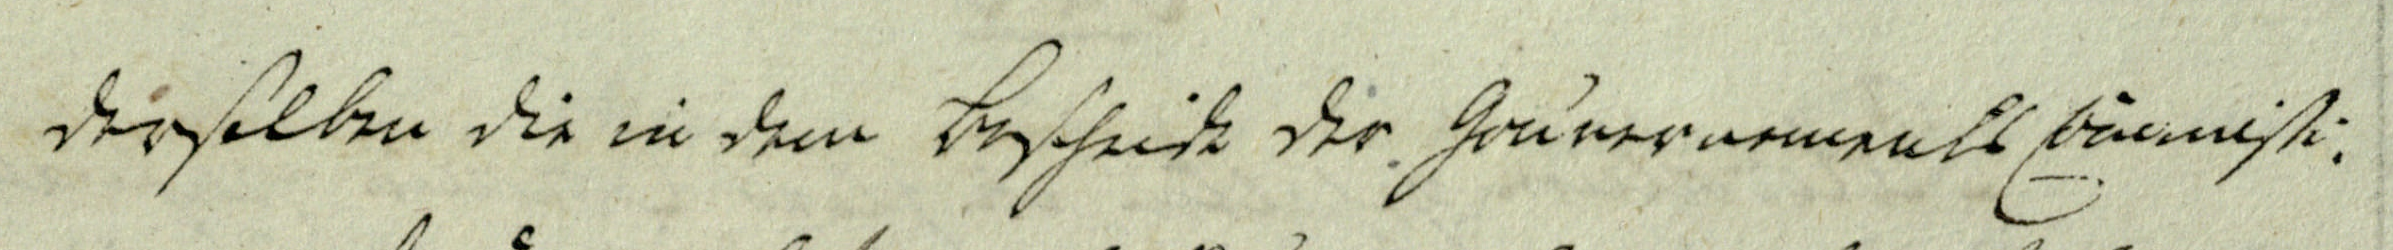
derselben die in dem Bescheide der Gouvernements Commissi¬
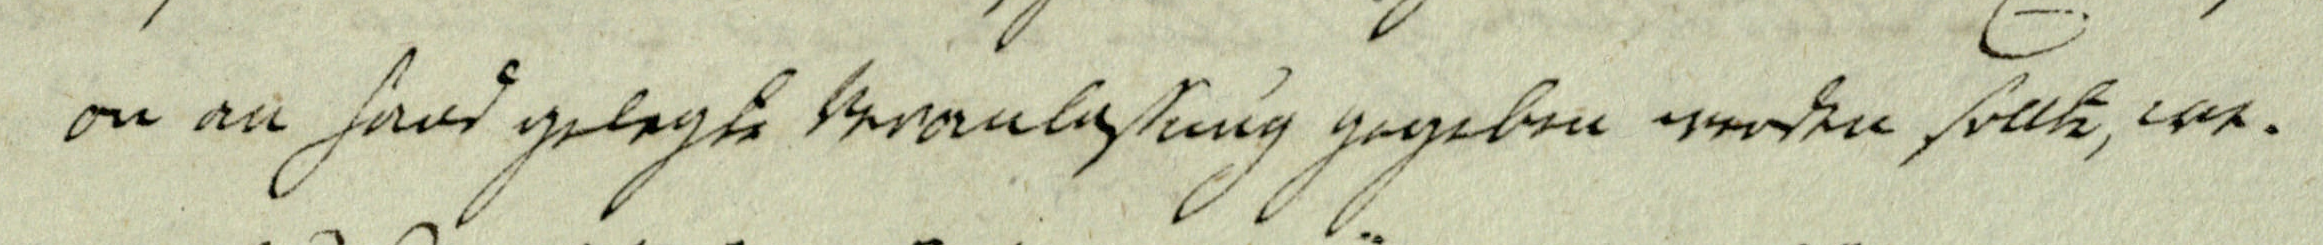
on an Hand gelegte Veranlassung gegeben werden sollte, we¬
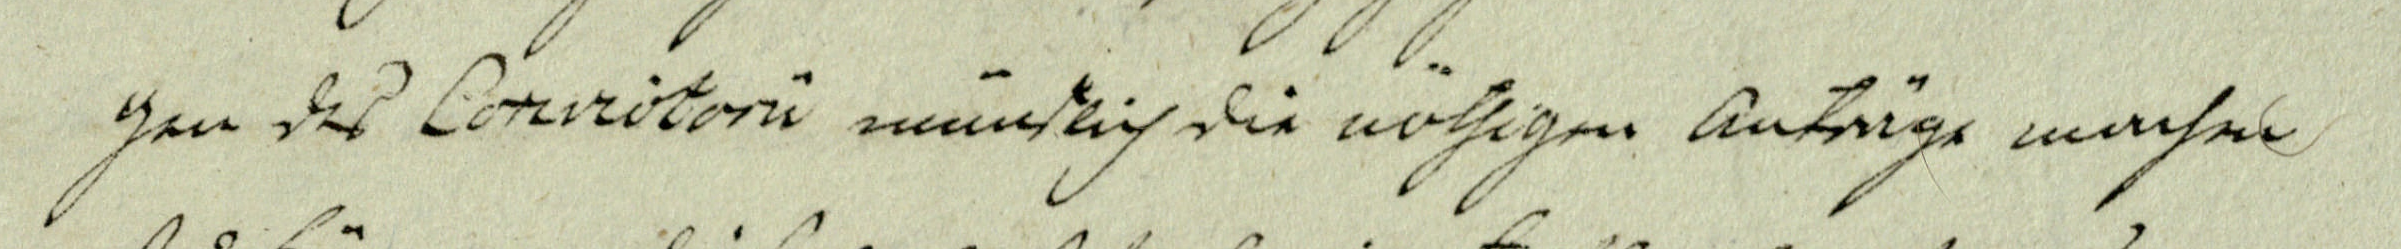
gen des Convictorii mündlich die nöthigen Anträge machen
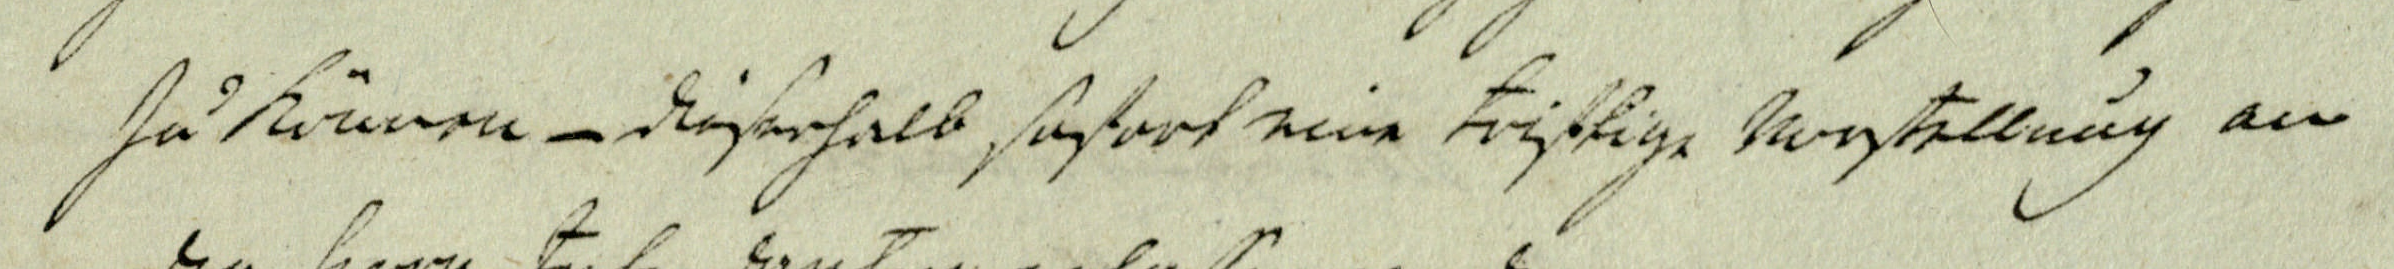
zu können - dieserhalb sofort eine triftige Vorstellung an
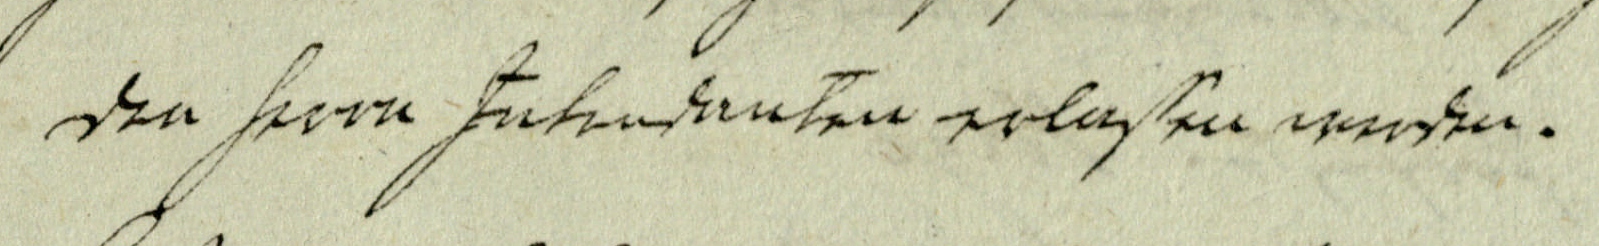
den Herrn Intendanten erlassen werden.
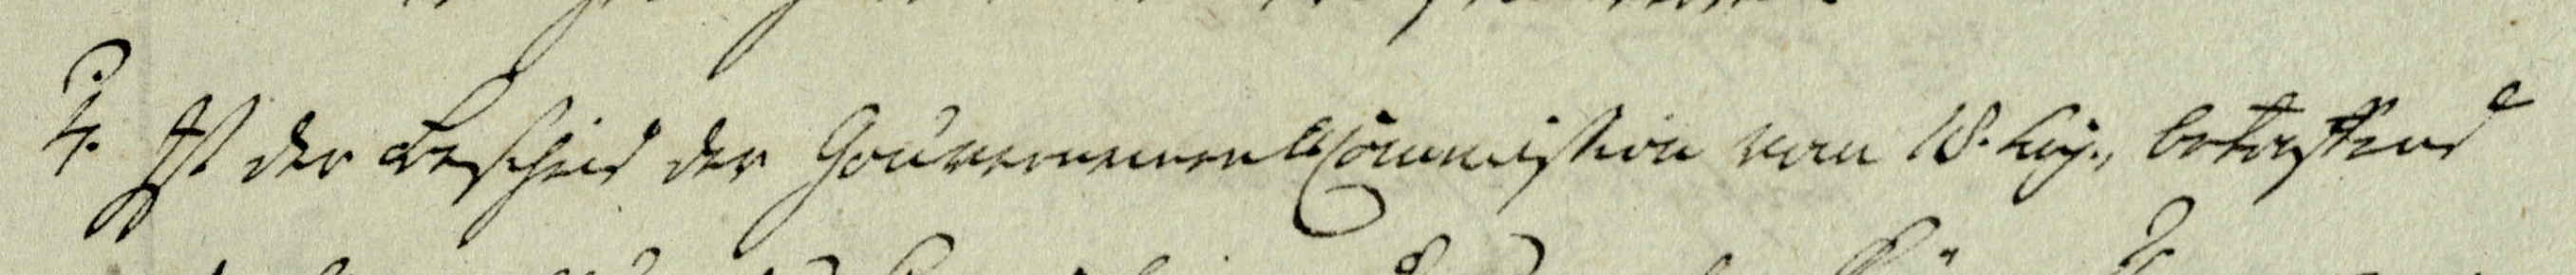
4. Ist der Bescheid der Gouvernements Commission vom 18 huj. betreffend
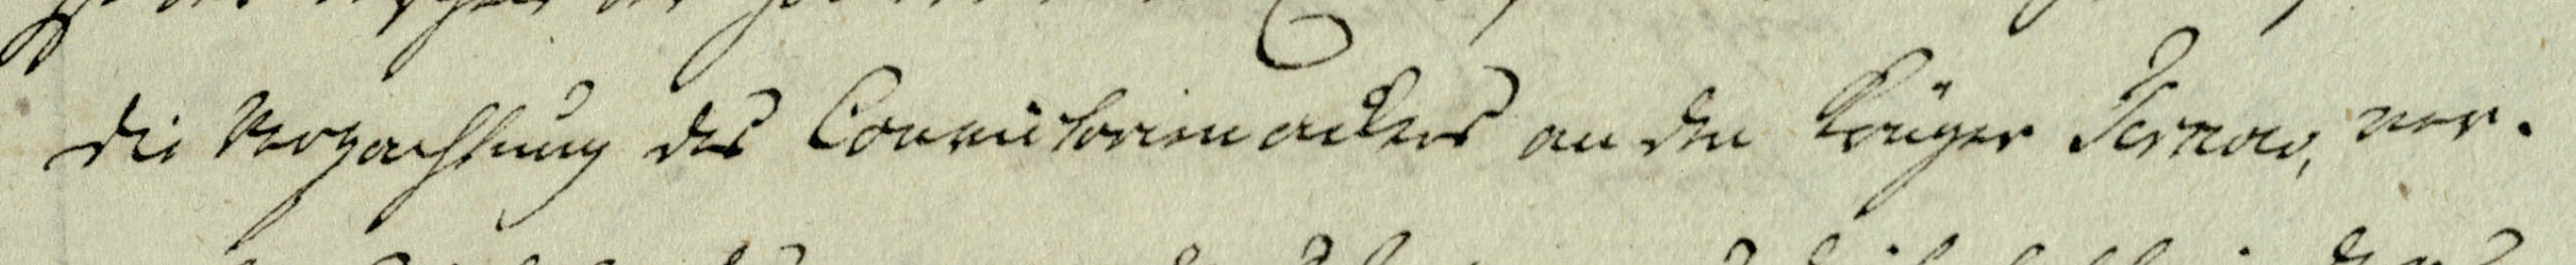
die Verpachtung des Convictorienackers an den Krüger Ternow, ver¬
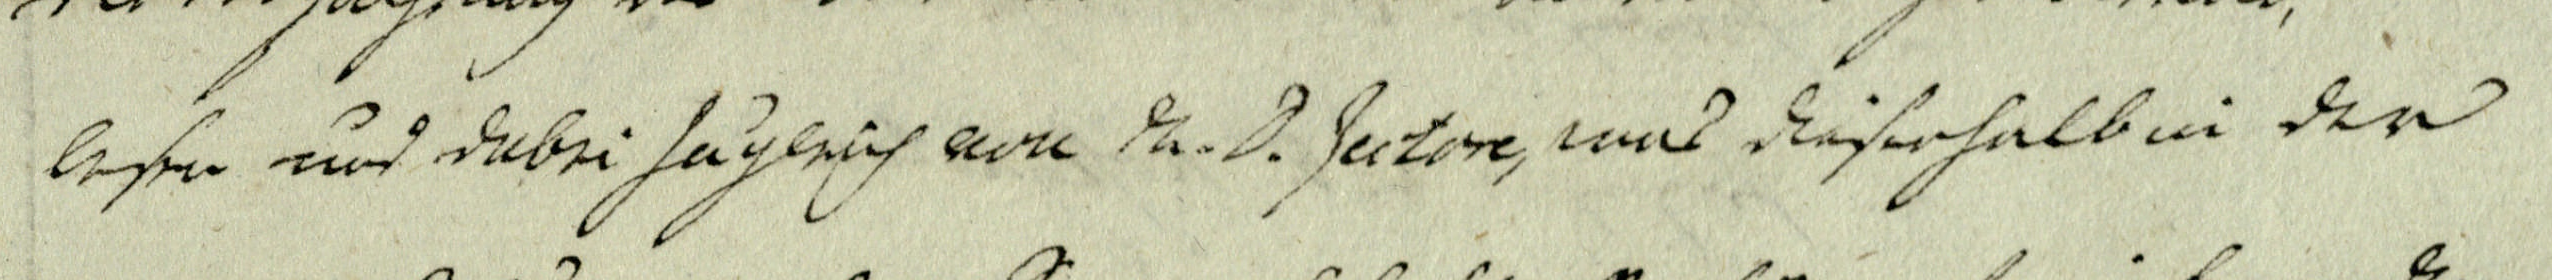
lesen und dabei zugleich von M. D. Rectore, was dieserhalb in der
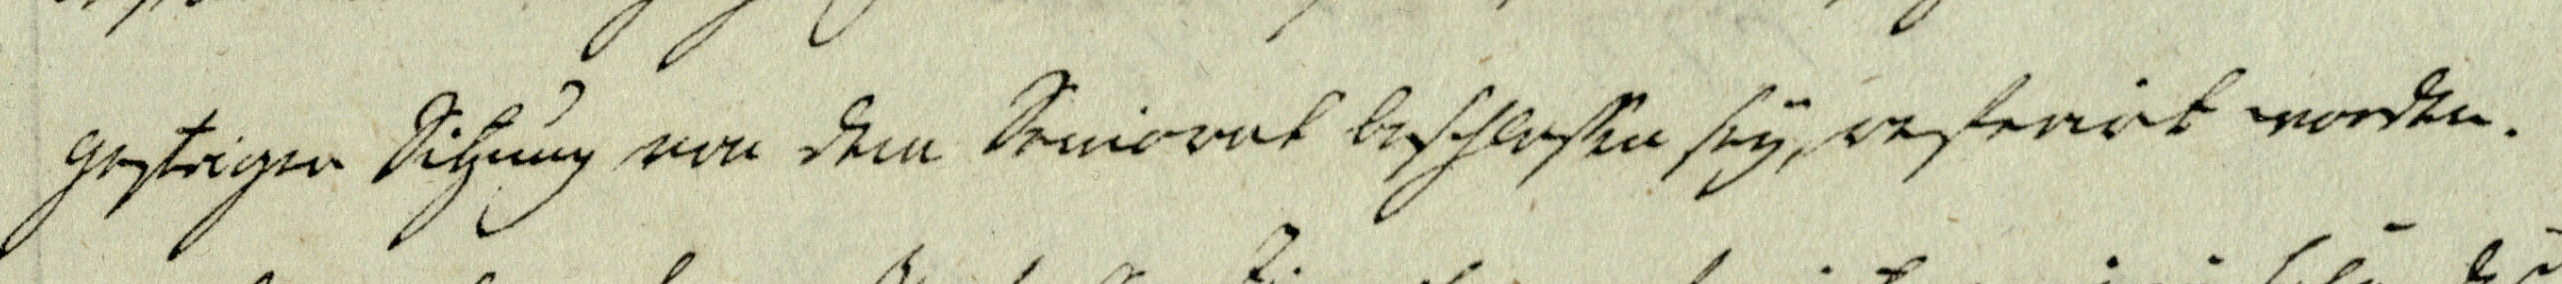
gestrigen Sitzung von dem Seniorat beschlossen seÿ, referirt worden.
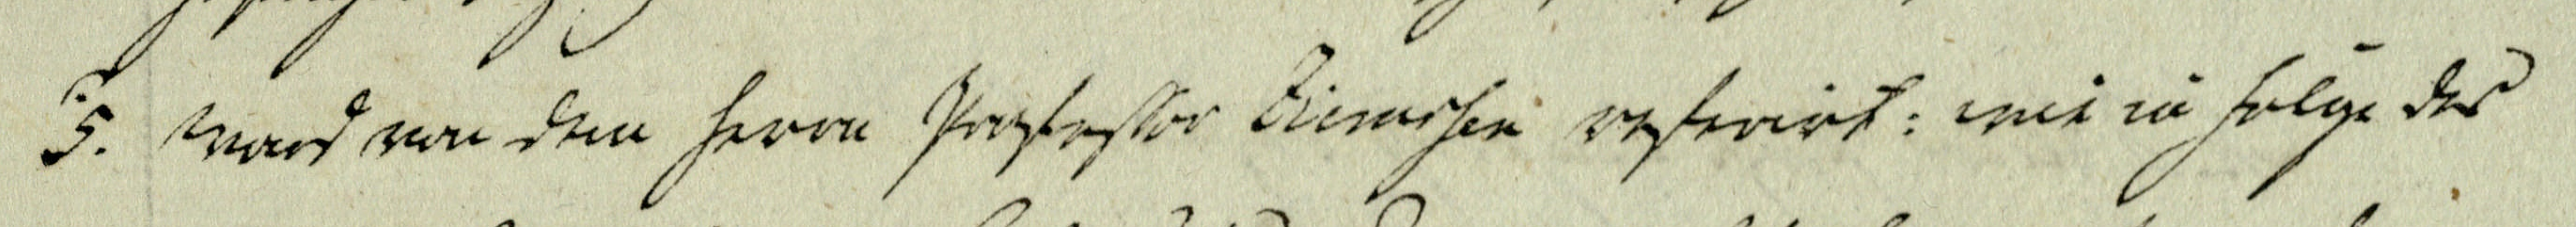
5. Ward von dem Herrn Professor Ziemssen referirt: wie in Folge des
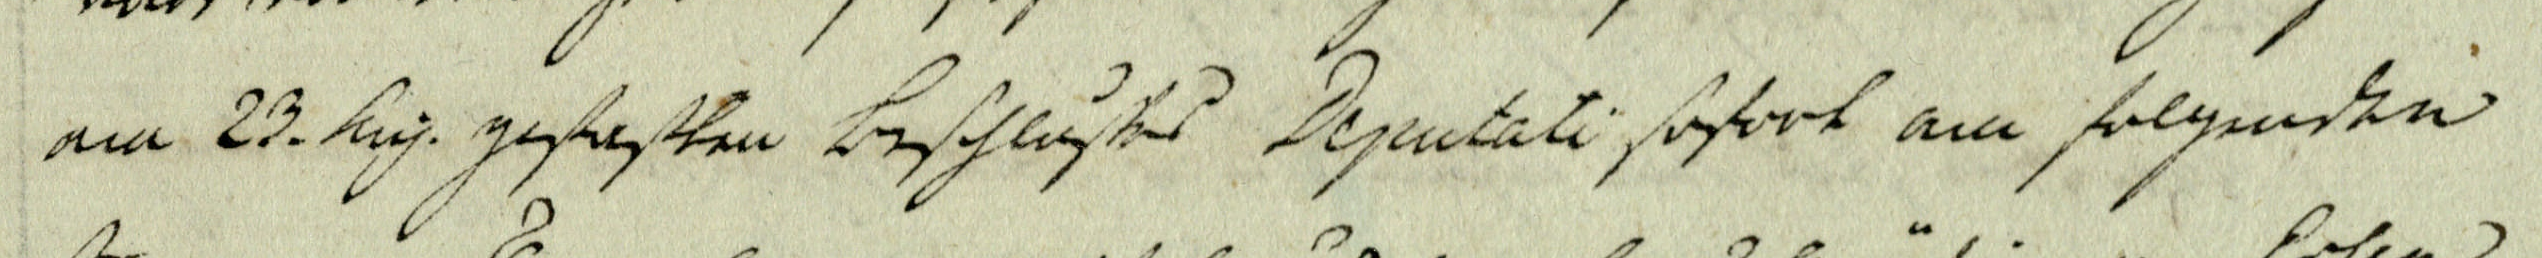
am 23. huj. gefaßten Beschlusses Deputati sofort am folgenden
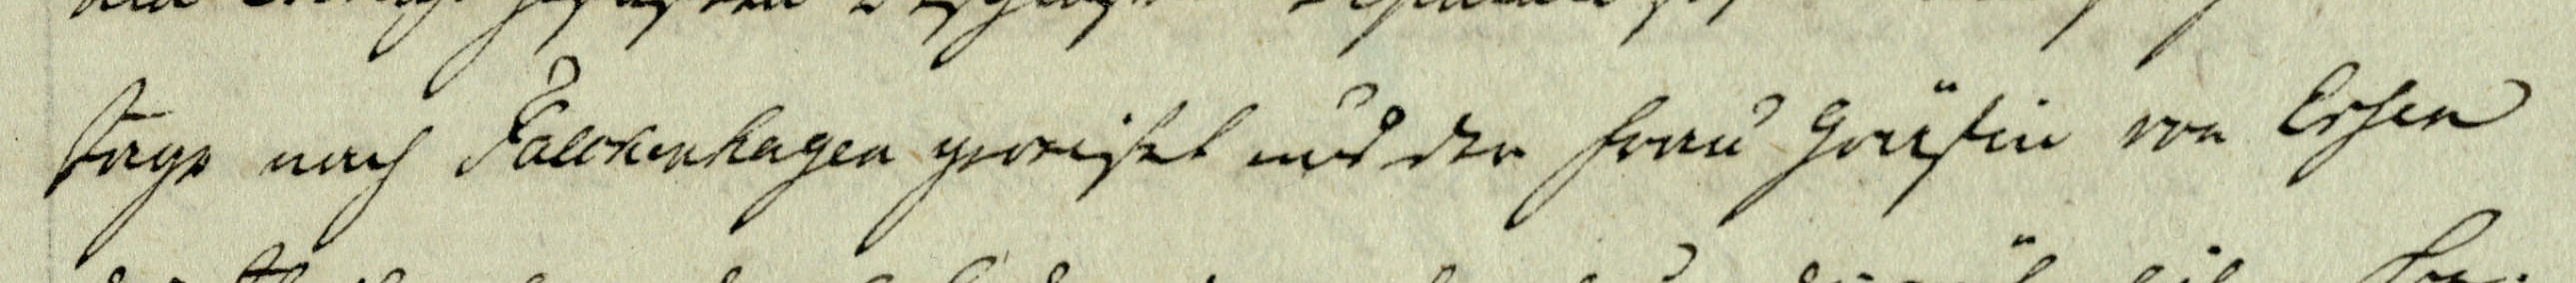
Tage nach Falckenhagen gereiset und der Frau Gräfin von Essen
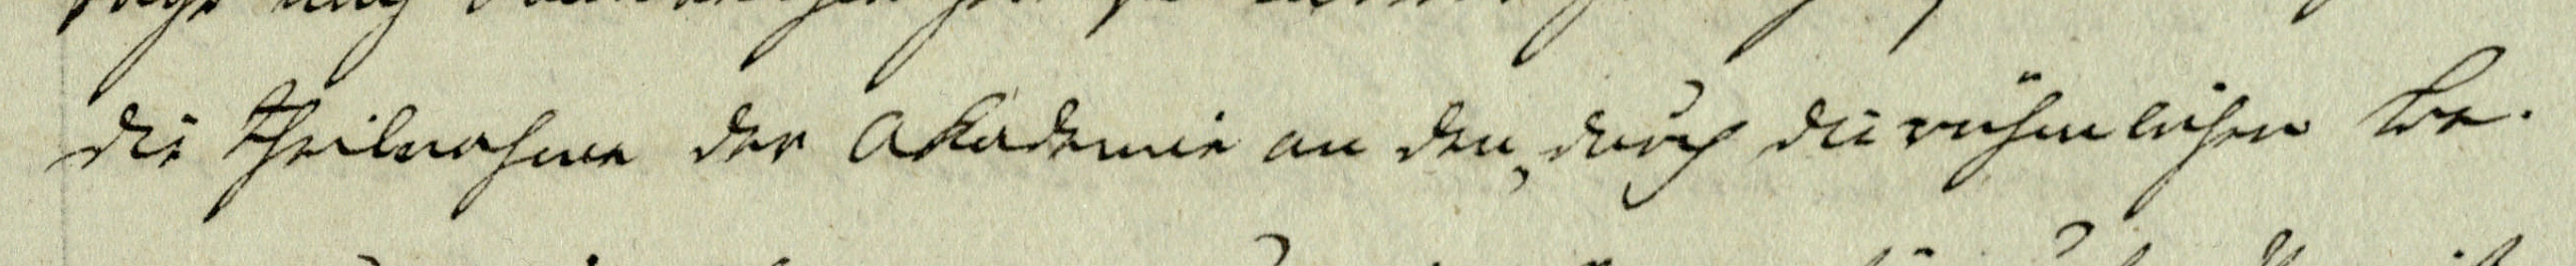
die Theilnahme der Akademie an den, durch die rühmlichen Be¬
